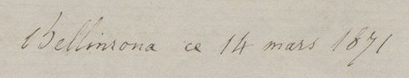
Bellinzona ce 14 mars 1871
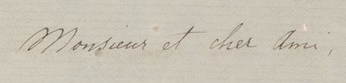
Monsieur et cher Ami,
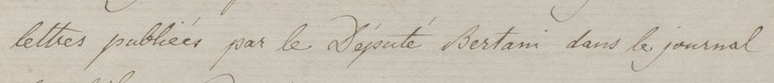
lettres publiées par le Député Bertani dans le journal
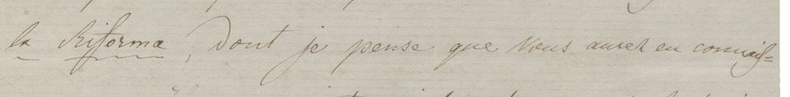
la Riforma, dont je pense que Vous aurez eu connais-
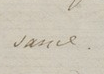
sance.
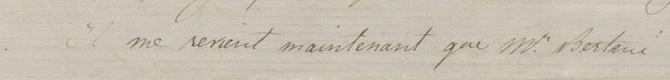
me revient maintenant que MrBertani
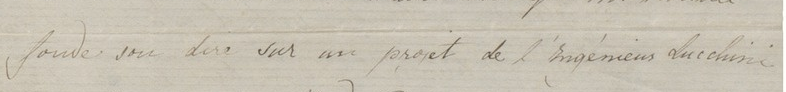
fonde son dire sur un projet de l'Ingénieur Lucchini
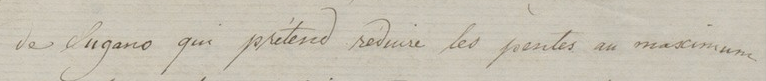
de Lugano qui prétend réduire les pentes au maximum
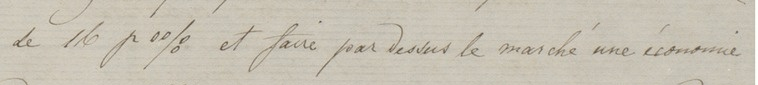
de 16 p00/00 et faire par dessus le marché une économie
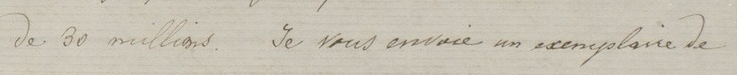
de 30 millions. Je vous envoie un exemplaire de
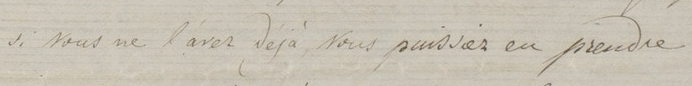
si Vous ne l'avez déjà, Vous puissiez en prendre
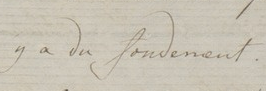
y a du fondement.
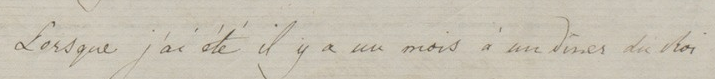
Lorsque j'ai été il y a un mois à un dîner du Roi
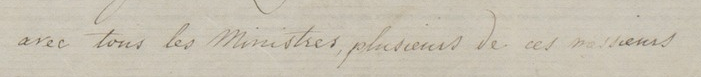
avec tous les Ministres, plusieurs de ces messieurs
